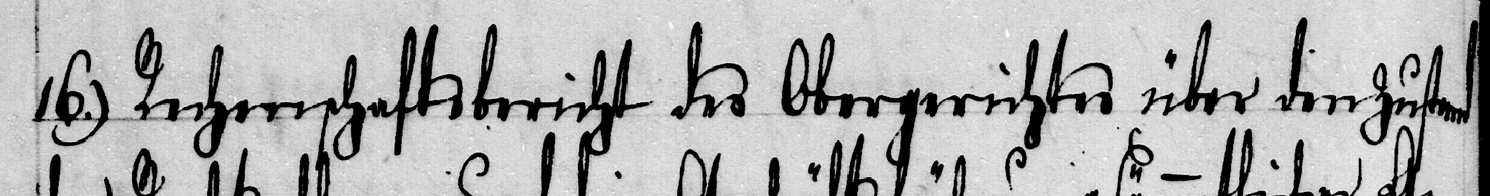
16.) Rechenschaftsbericht des Obergerichtes über den Zust¬
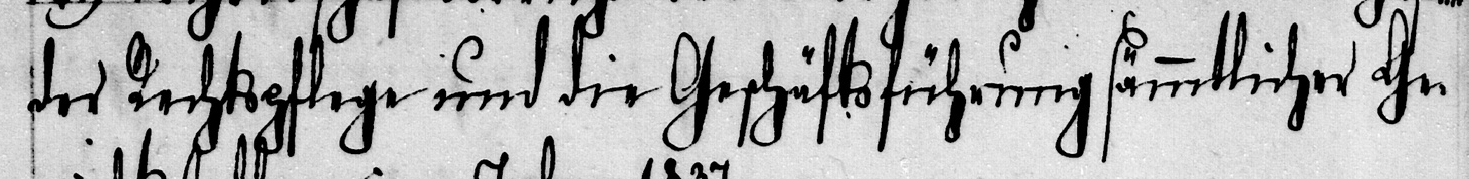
der Rechtspflege und die Geschäftsführung sämmtlicher Ge¬
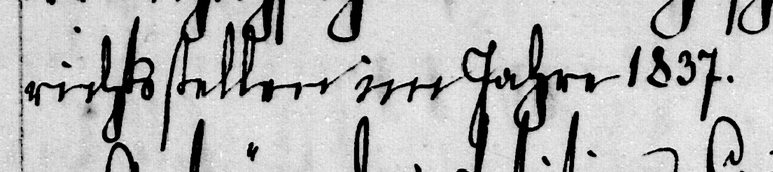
richtsstellen im Jahre 1837.
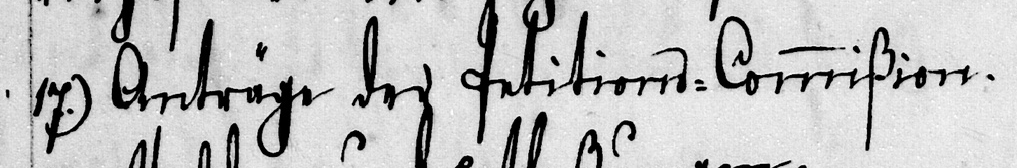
17.) Anträge der Petitions-Commißion.
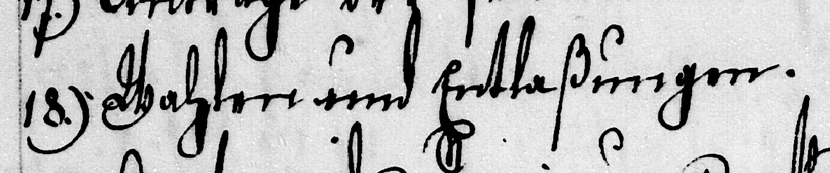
18.) Wahlen und Entlaßungen.
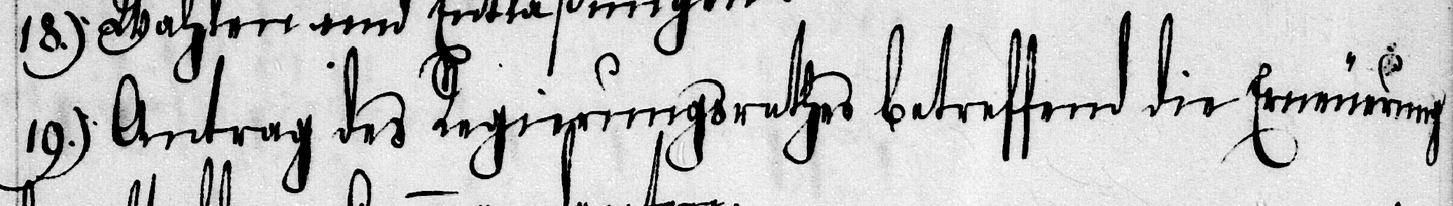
19.) Antrag des Regierungsrathes betreffend die Erneuerung
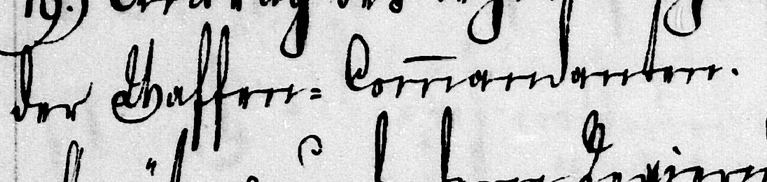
der Waffen-Commandanten.
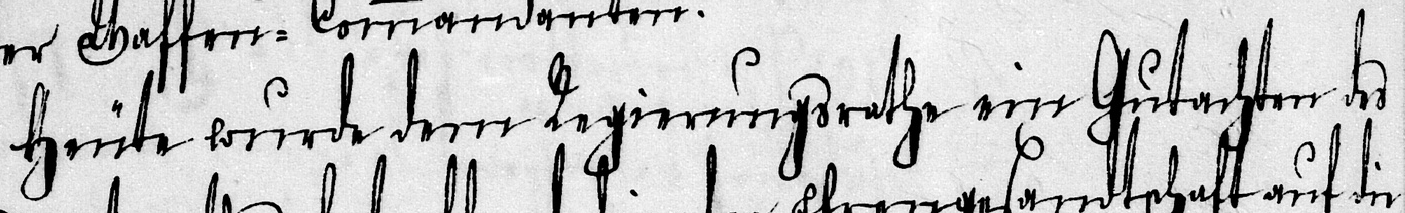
Heute wurde dem Regierungsrathe ein Gutachten des
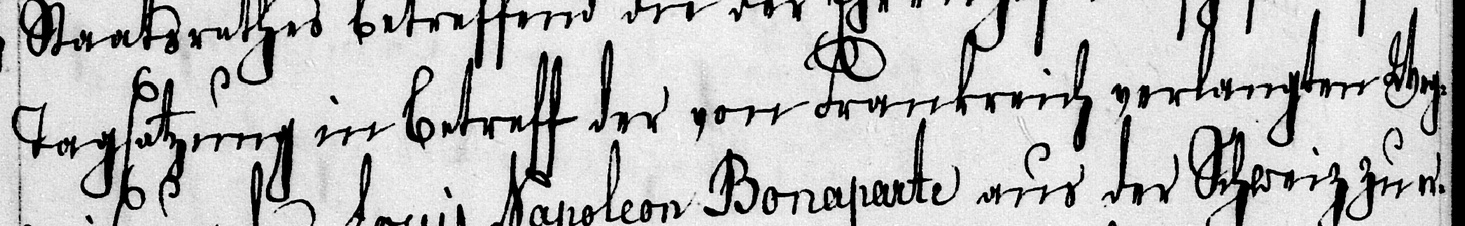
Tagsatzung in Betreff der von Frankreich verlangten Weg¬
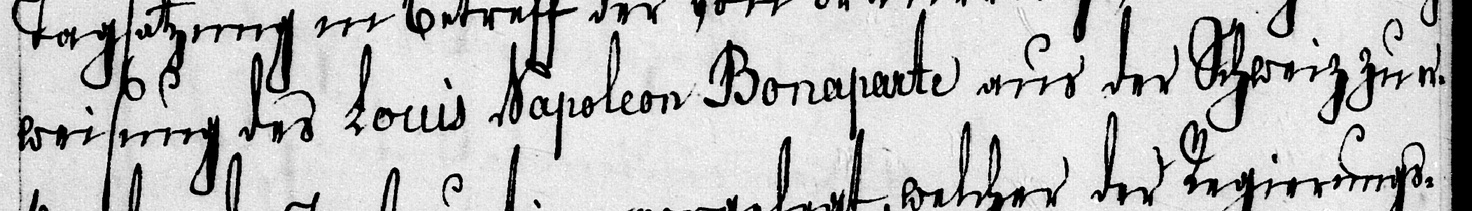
weisung des Louis Napoleon Bonaparte aus der Schweiz zu er¬
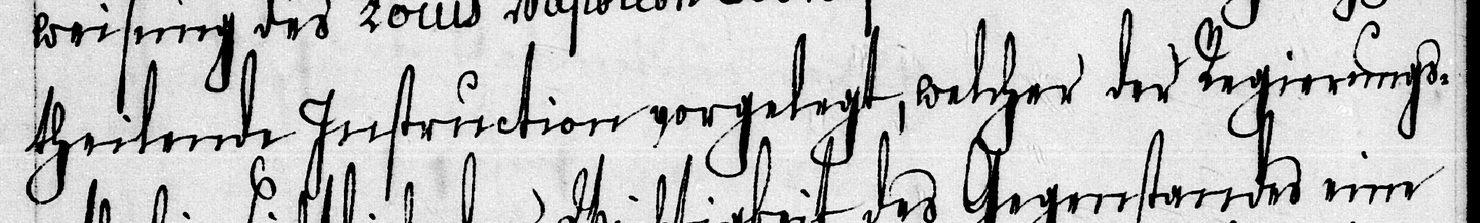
theilende Instruction vorgelegt, welcher der Regierungs¬
